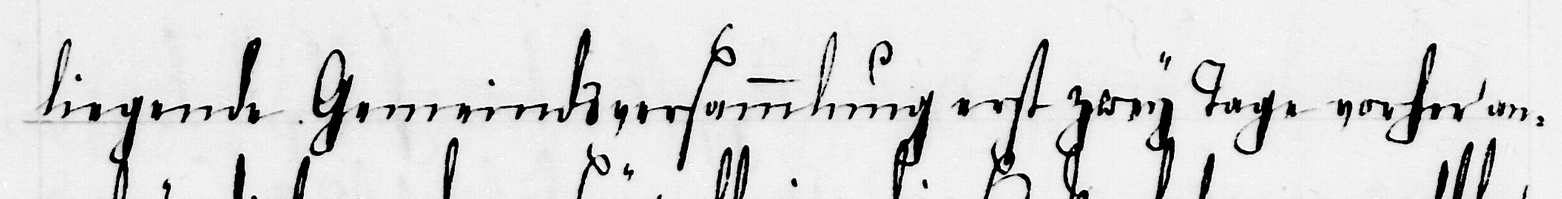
liegende Gemeindsversammlung erst zwey Tage vorher an¬
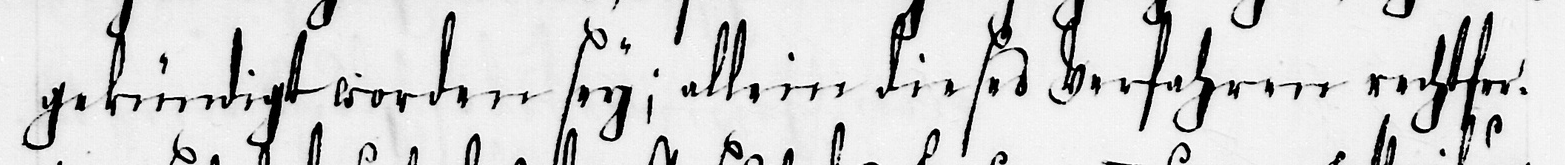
gekündigt worden sey; allein dieses Verfahren rechtfer¬
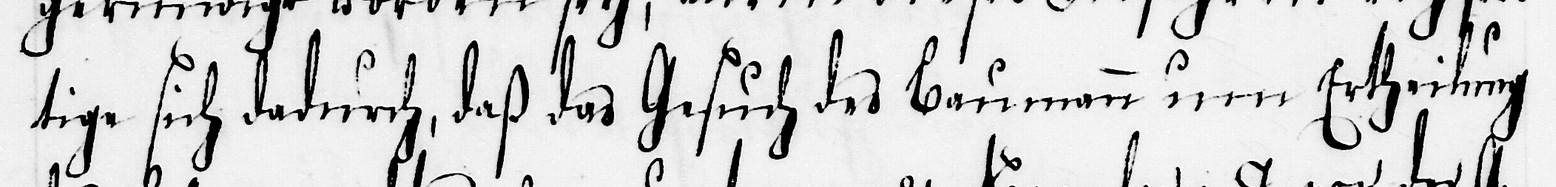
tige sich dadurch, daß das Gesuch des Baumann um Ertheilung
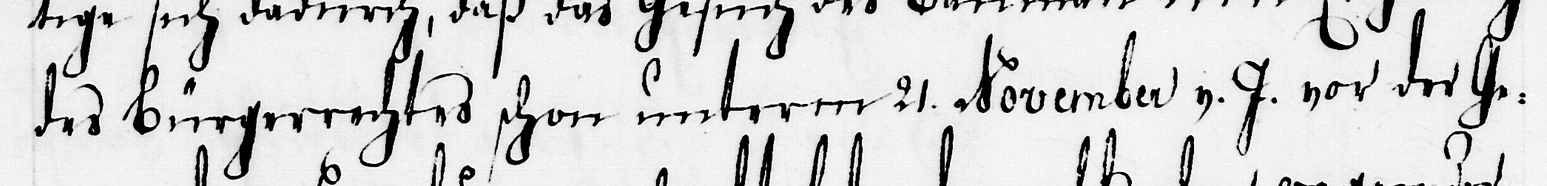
des Bürgerrechtes schon unterm 21. November v. J. vor der Ge¬
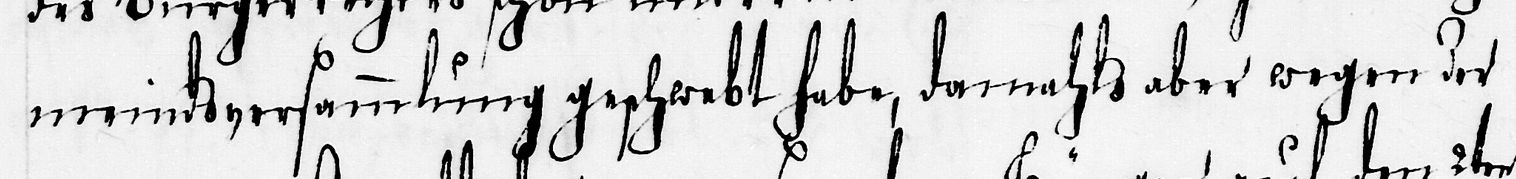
meindsversammlung geschwebt habe, damahls aber wegen der
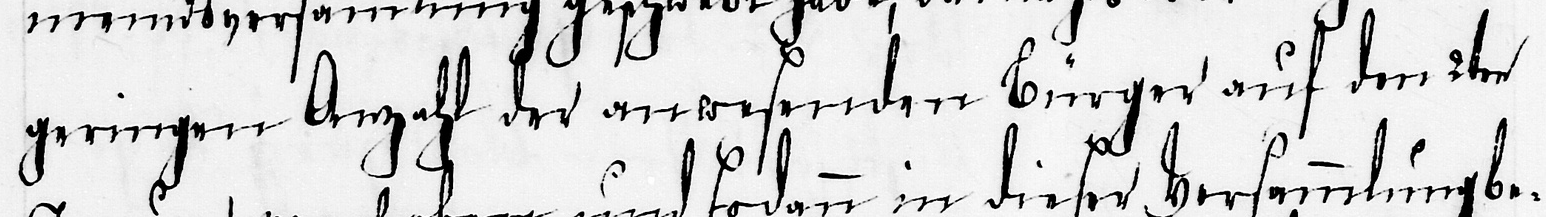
geringen Anzahl der anwesenden Bürger auf den 2ten
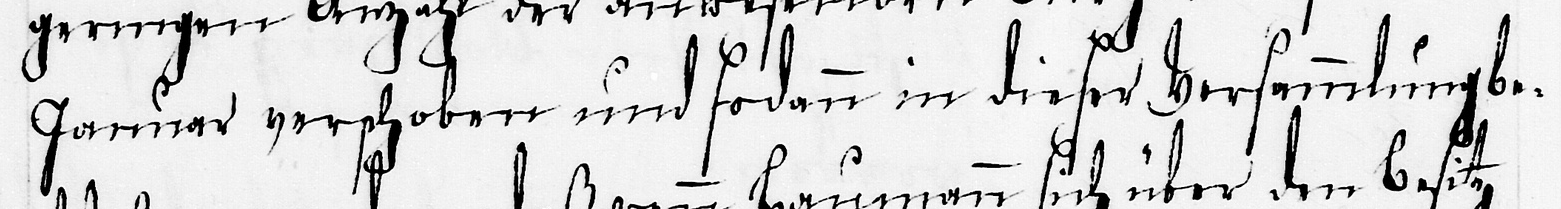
Januar verschoben und sodann in dieser Versammlung be¬
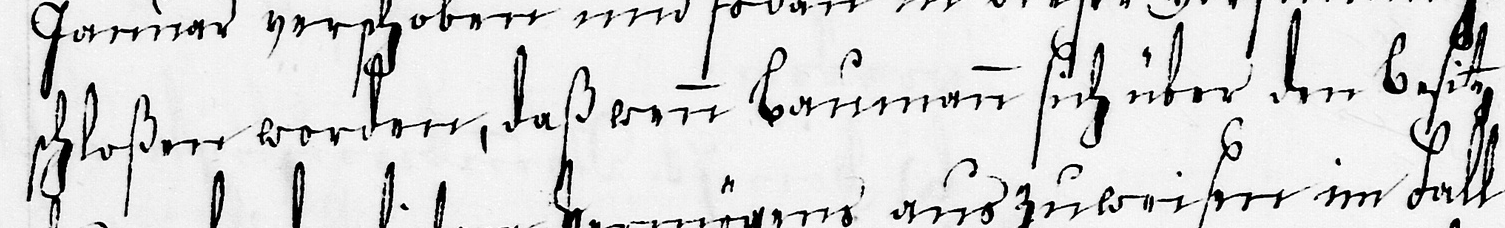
schloßen worden, daß wenn Baumann sich über den Besitz
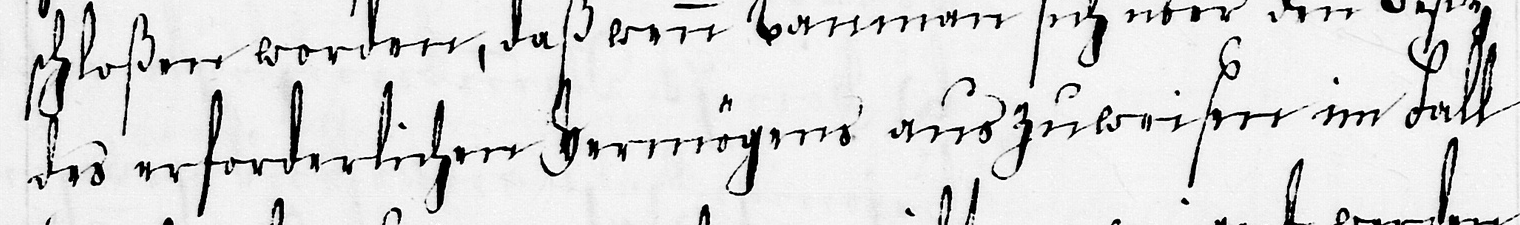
des erforderlichen Vermögens auszuweisen im Fall
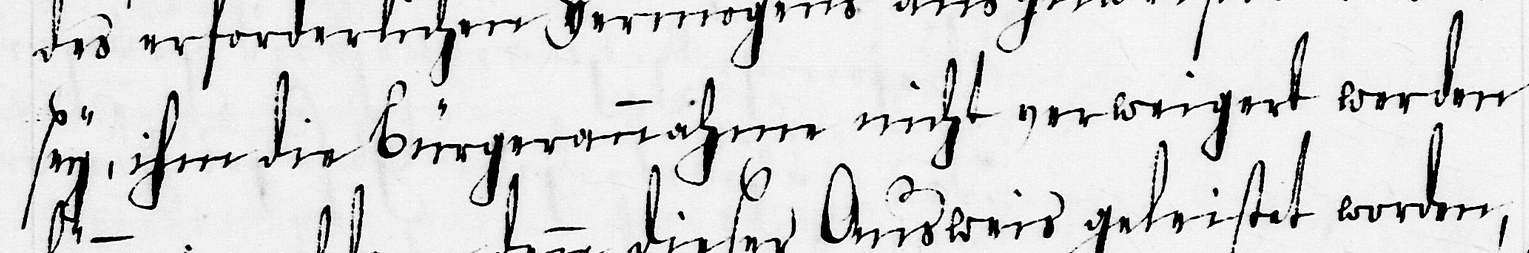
sey, ihm die Bürgerannahme nicht verweigert werden
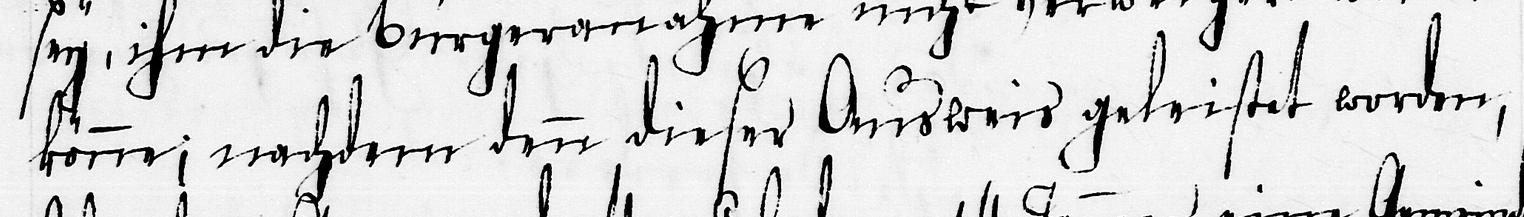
könne; nachdem denn dieser Ausweis geleistet worden,
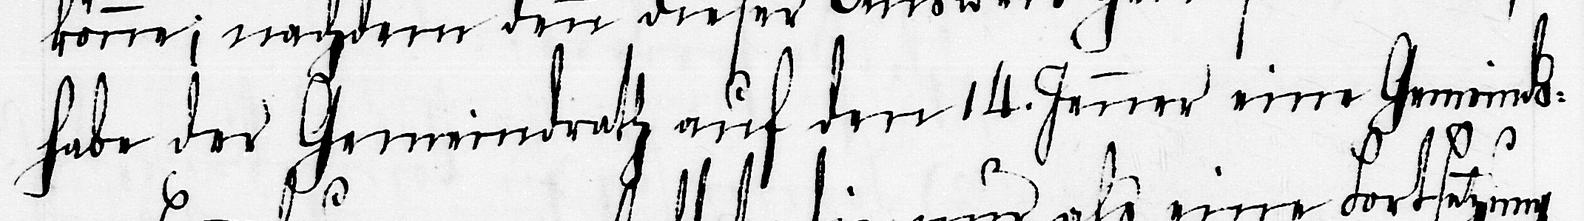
habe der Gemeindrath auf den 14. Jenner eine Gemeinds¬
